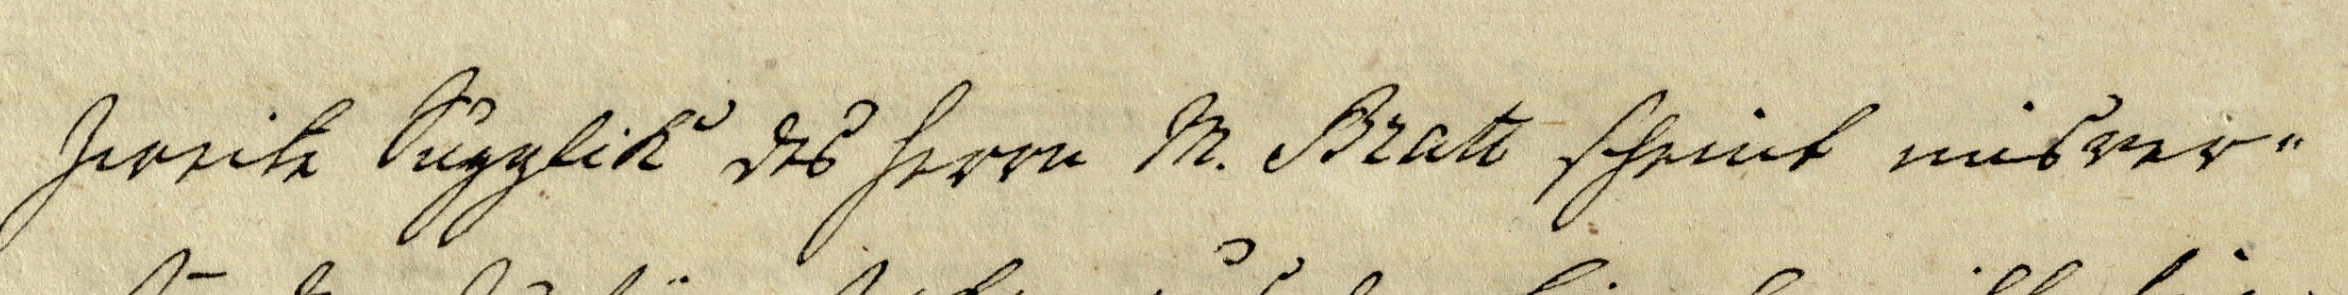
zweite Supplik des Herrn M. Bratt scheint misver¬
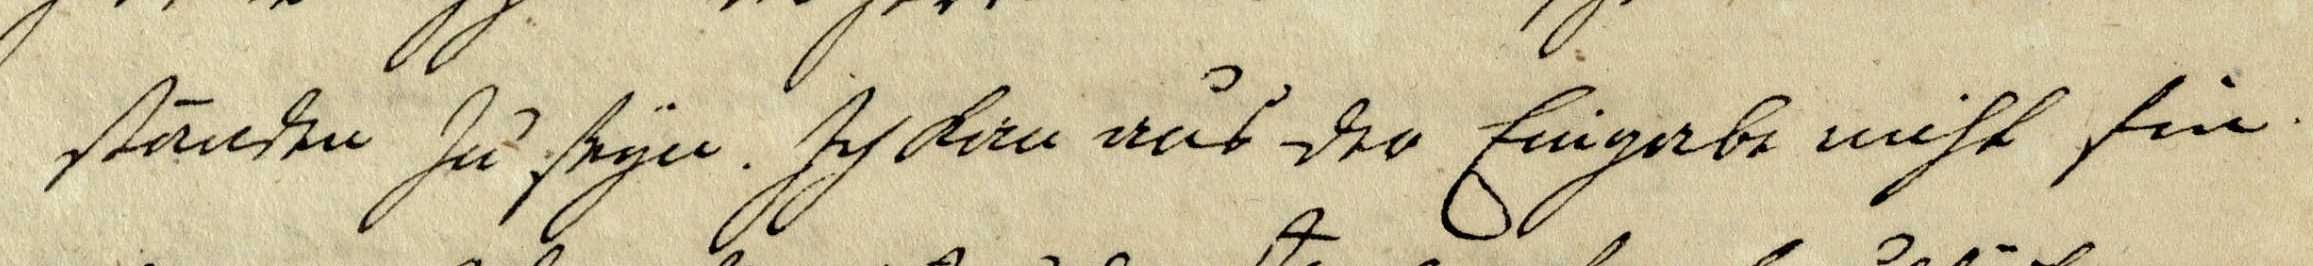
standen zu seÿn. Ich kan aus der Eingabe nicht fin¬
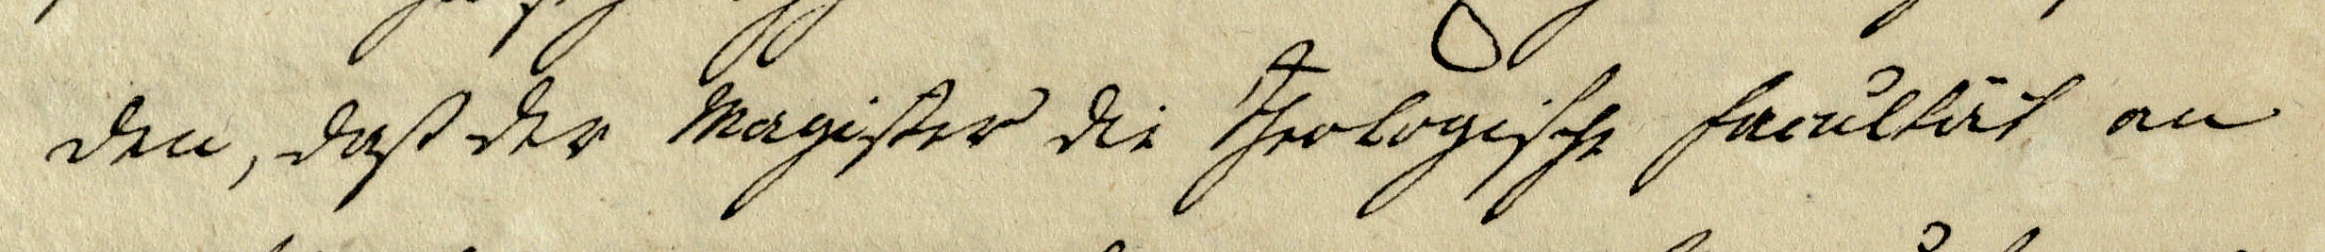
den, daß der Magister die Theologische Facultät an
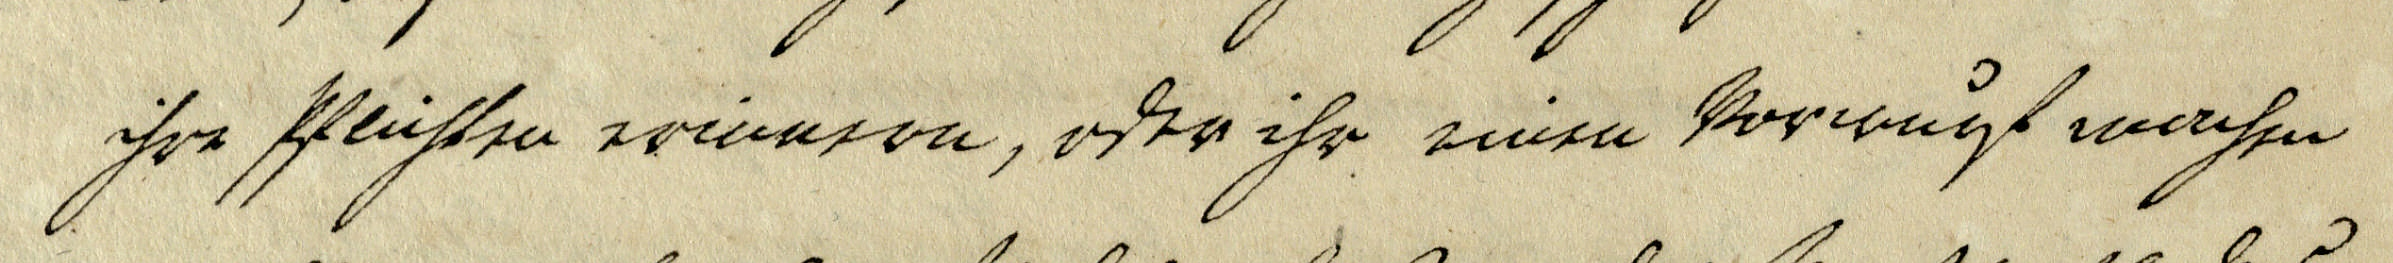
ihre Pflichten erinnern, oder ihr einen Vorwurf machen
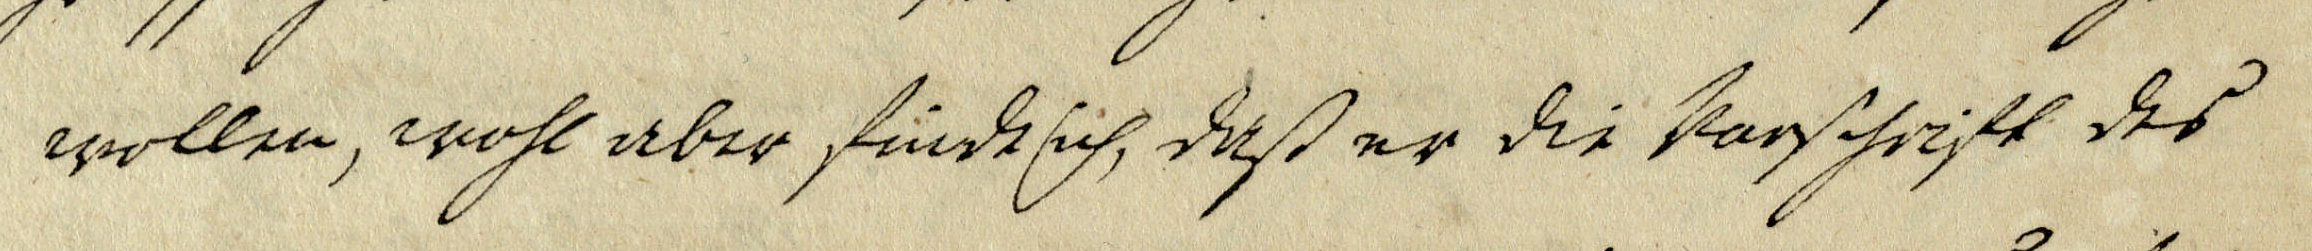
wollen, wohl aber finde ich, daß er die Vorschrift des
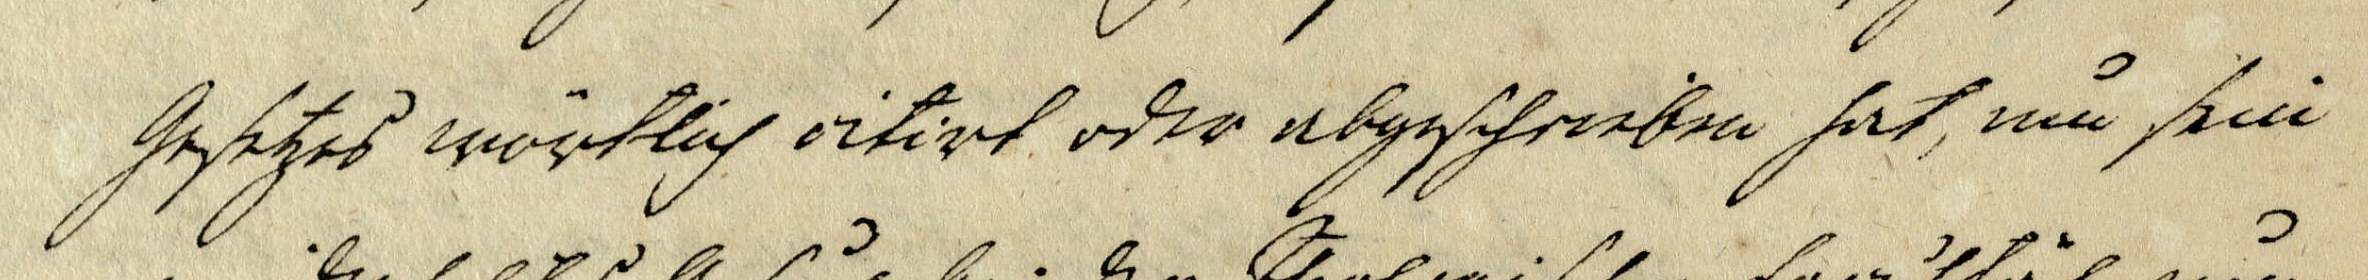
Gesetzes wörtlich citirt oder abgeschrieben hat, um sein
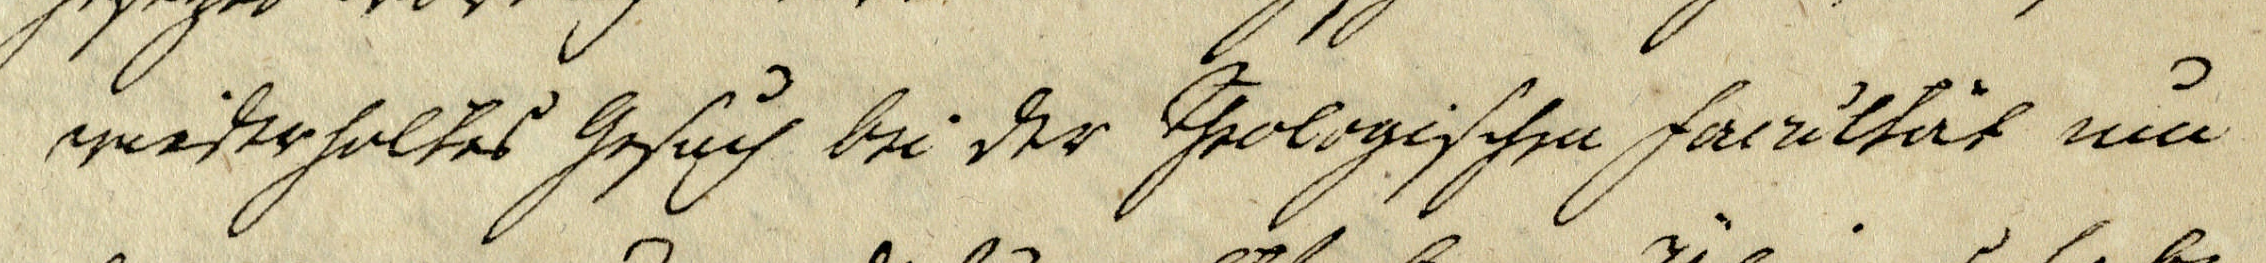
wiederholtes Gesuch bei der Theologischen Facultät um
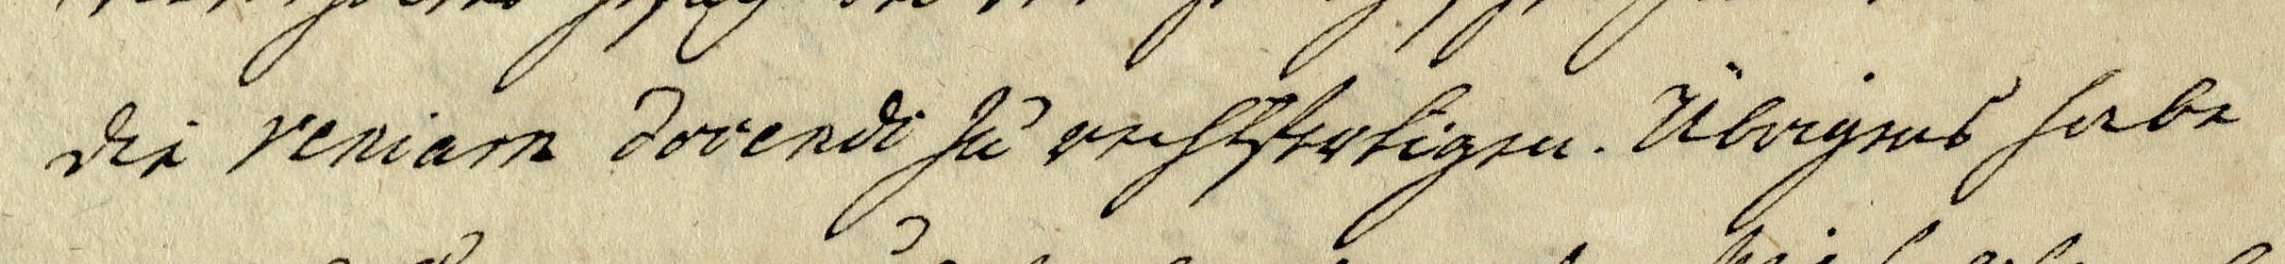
die veniam docendi zu rechtfertigen. Übrigens habe
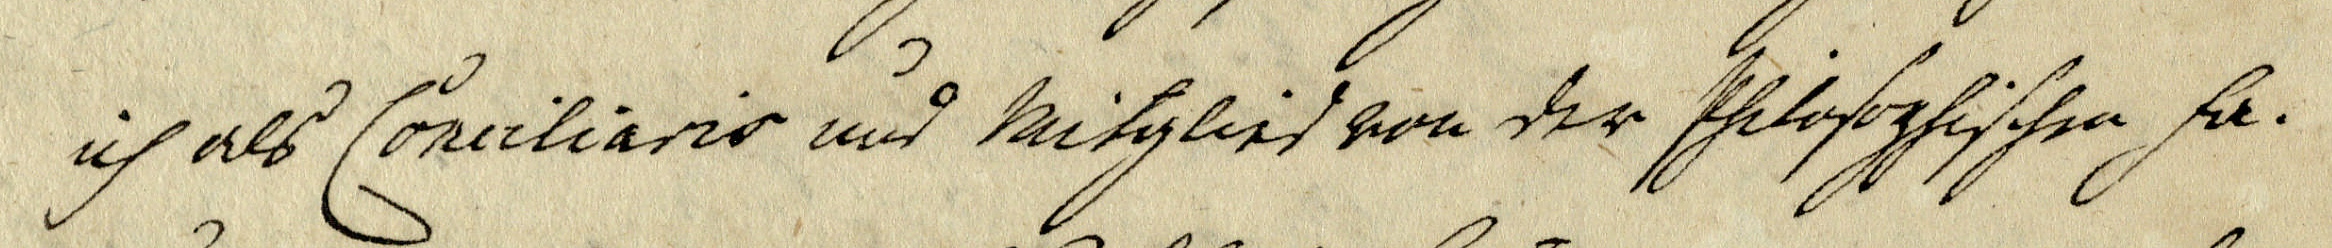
ich als Conciliaris und Mitglied von der Philosophischen Fa¬
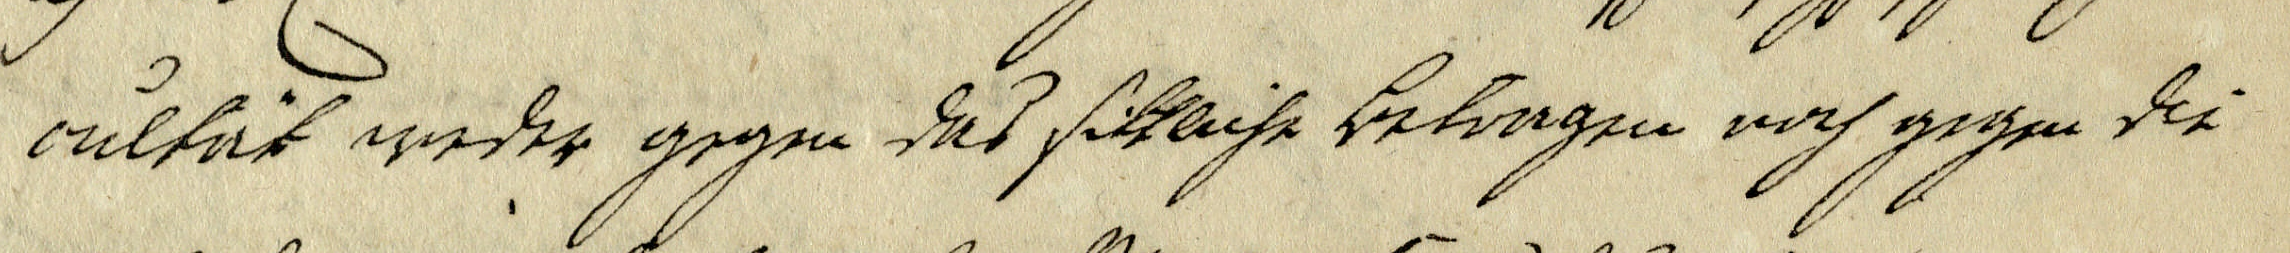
cultät weder gegen das sittliche Betragen auch gegen die
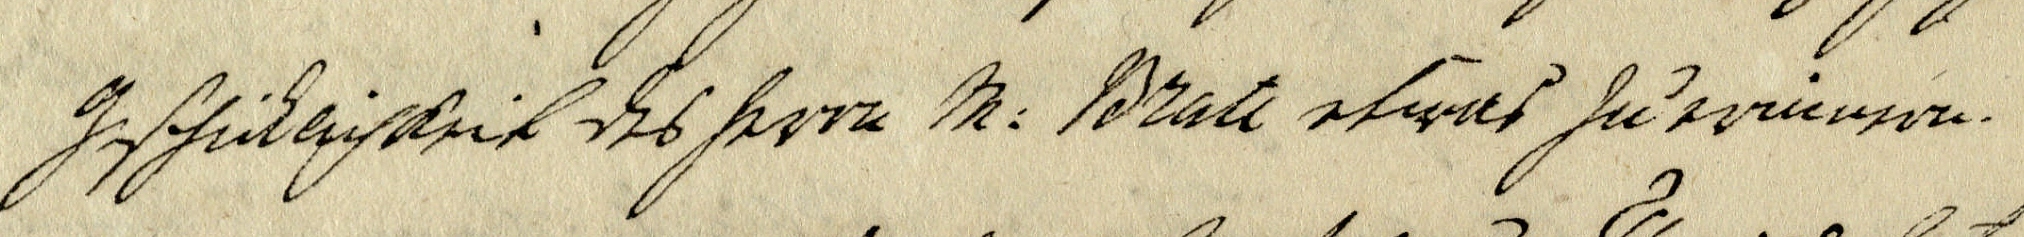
Geschicklichkeit des Herrn M. Bratt etwas zu erinnern.
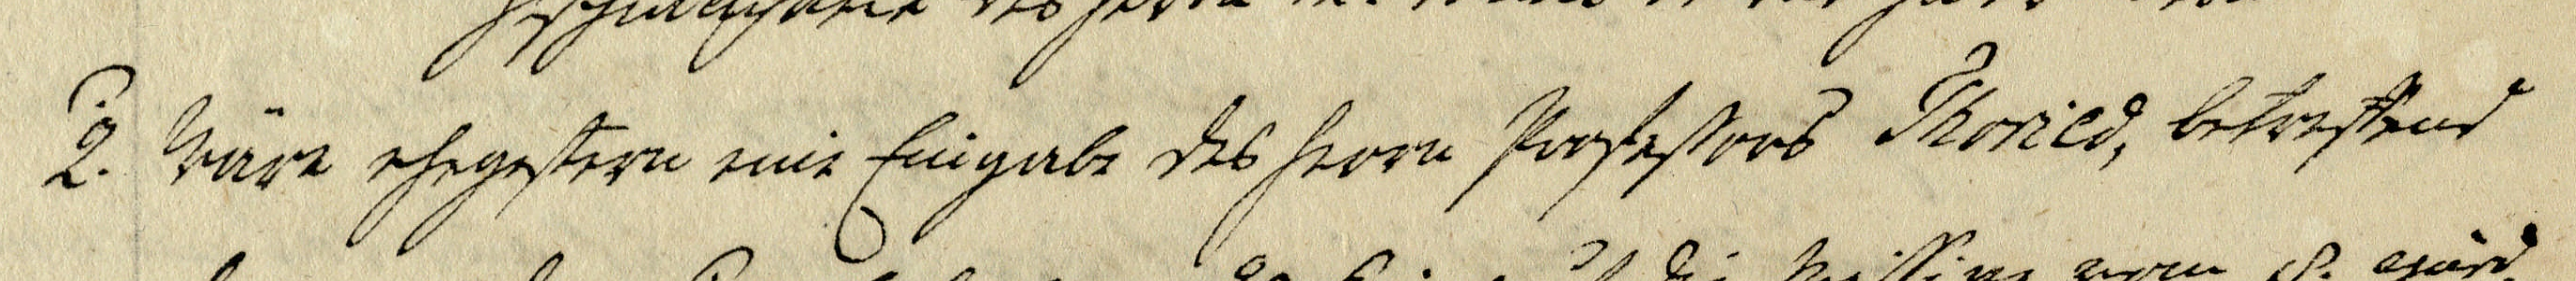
2. Wäre ehegestern eine Eingabe des Herrn Professors Thorild, betreffend
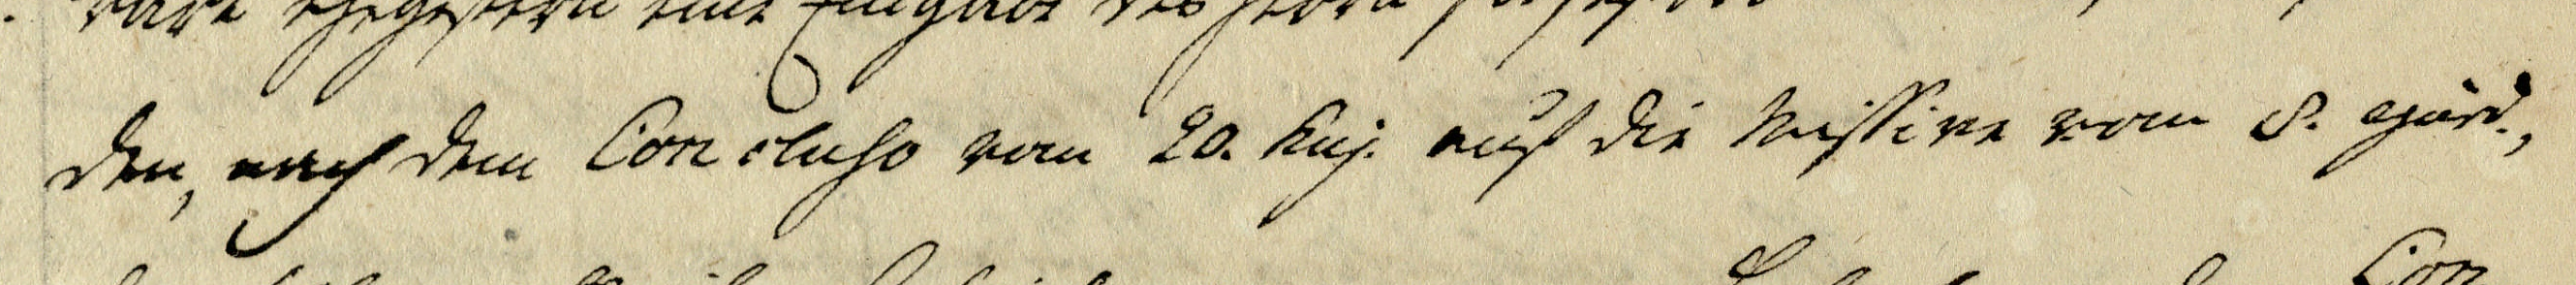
den, nach dem Concluso vom 20. huj. auf die Missive vom 8. ejusd.,
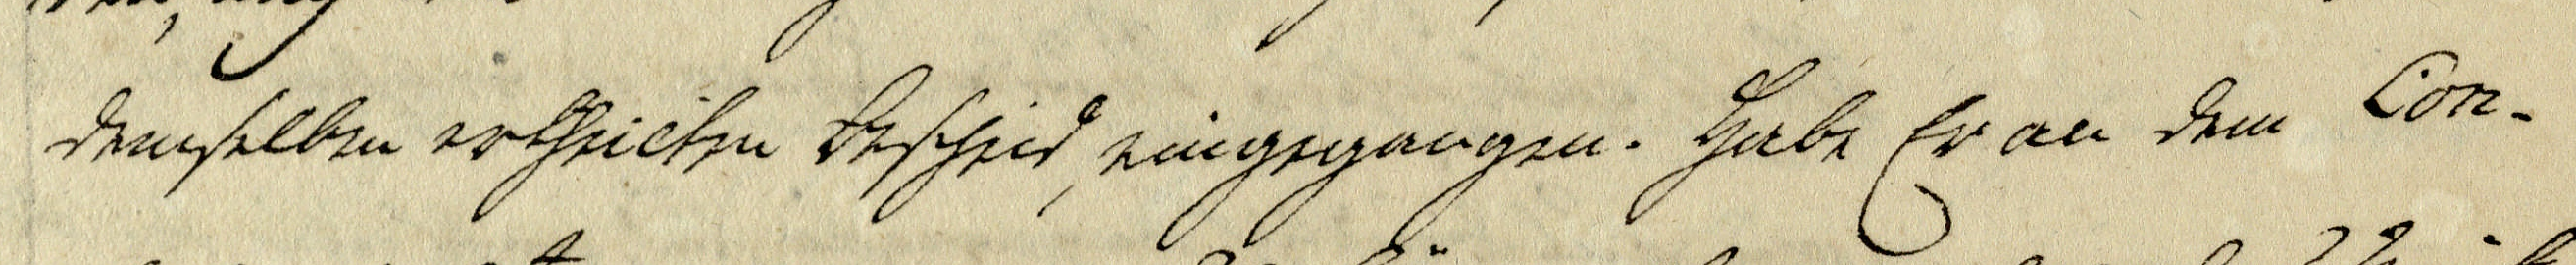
demselben ertheilten Bescheid eingegangen. Habe Er an dem Con¬
